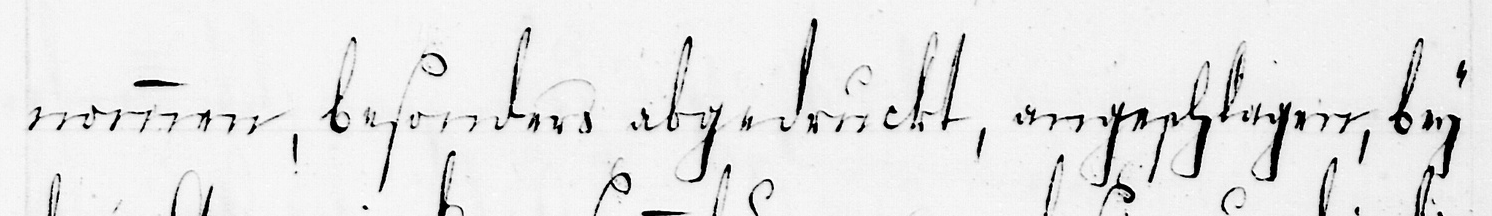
nommen, besonders abgedruckt, angeschlagen, bey
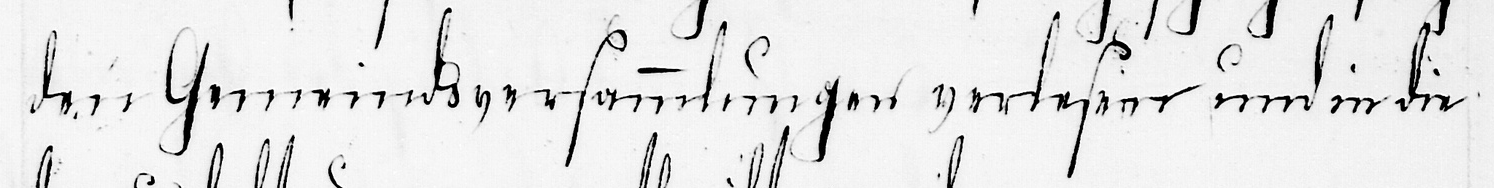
den Gemeindsversammlungen verlesen und in die
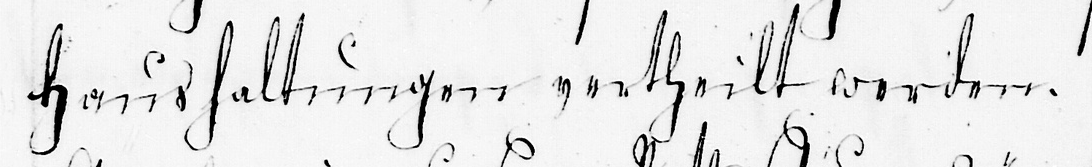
Haushaltungen vertheilt werden.
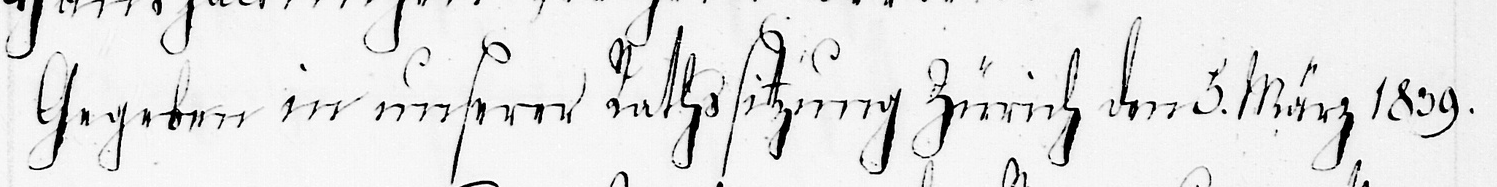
Gegeben in unserer Rathssitzung Zürich den 5. März 1839.
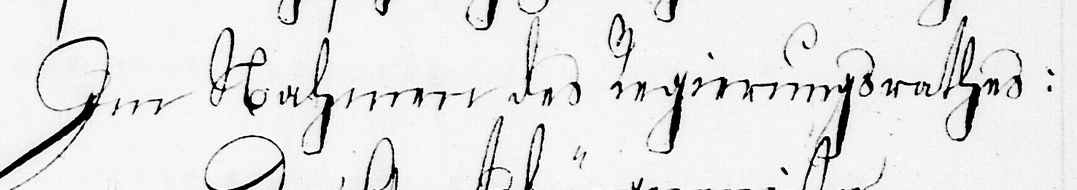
Im Nahmen des Regierungsrathes:
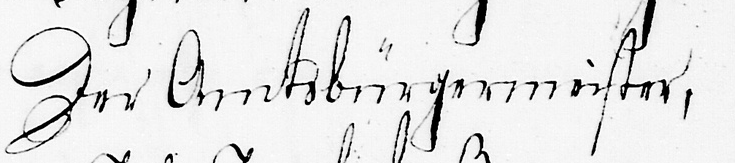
Der Amtsbürgermeister,
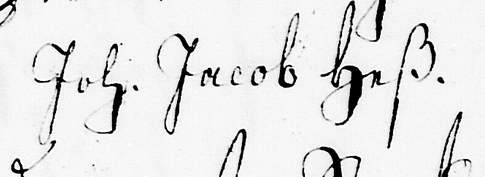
Joh. Jacob Heß.
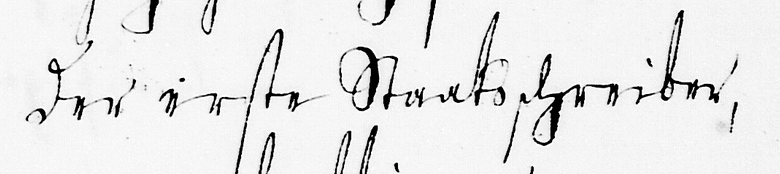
Der erste Staatsschreiber,
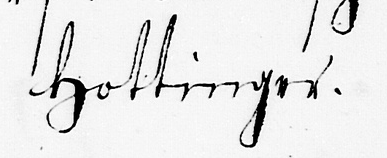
Hottinger.
